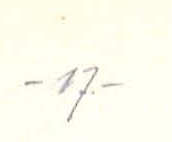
17.
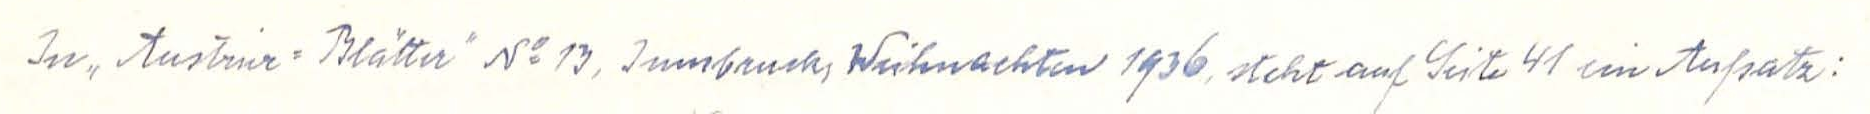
In "Austria - Blätter" N° 13, Innsbruck, Weihnachten 1936 steht auf Seite 41 im Aufsatz:
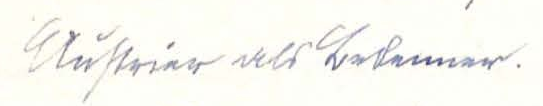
Austria und Bekenner
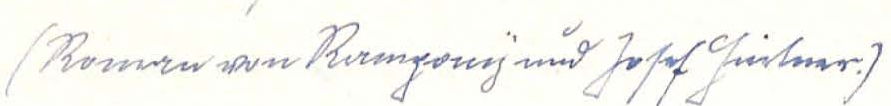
(Roman von Ramponij und Josef Hintner.)
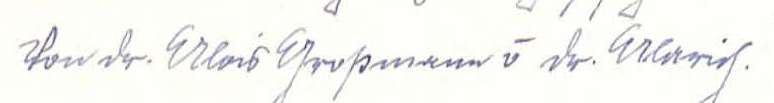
VOn Dr. Alois Grossmann v/o Dr. Alarich.
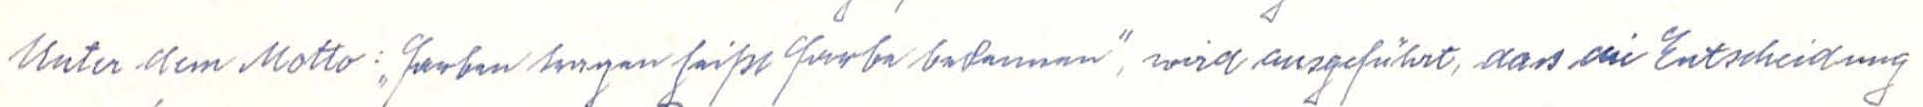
Unter dem Motto: "Farben tragen heißt Farbe bekennen", wird ausgeführt, dass die Entscheidung
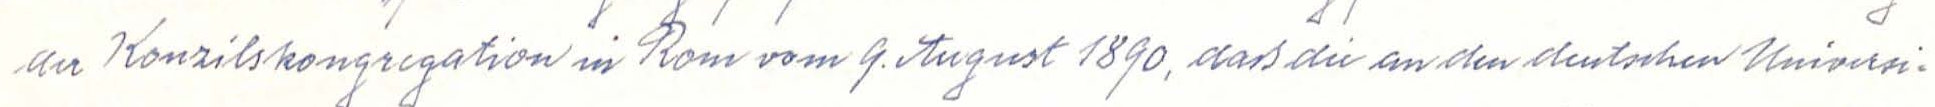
der Konzilskongregation in Rom vom 9. August 1890, dass die an den deutschen Universi-
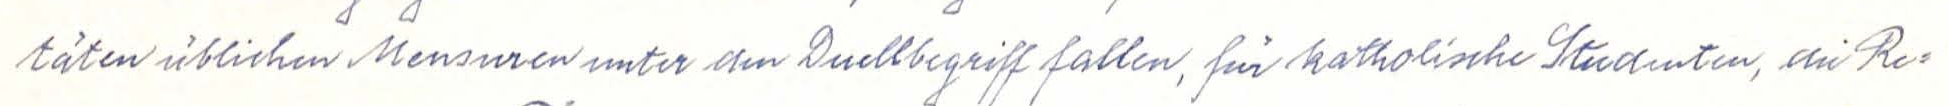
täten üblichen Mensuren unter den Duellbegriff fallen, für katholische Studenten, die Re-
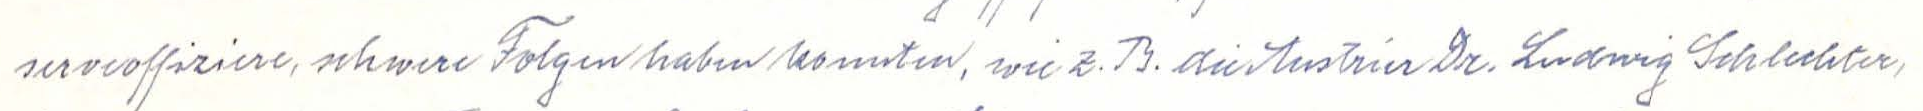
serveoffiziere, schwere Folgen haben konnten, wie z.B. die Austrier Dr. Ludwig Schlechter,
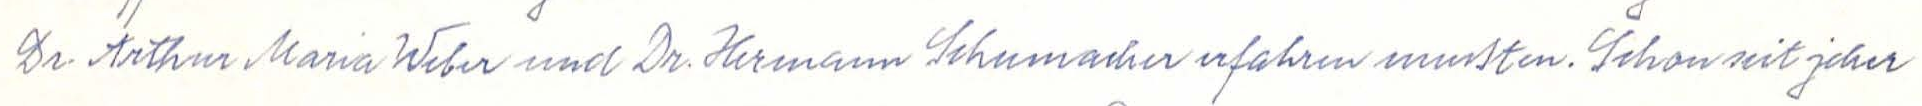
Dr. Arthur Maria Weber und Dr. Hermann Schumacher erfahren mussten. Schon seit jeher
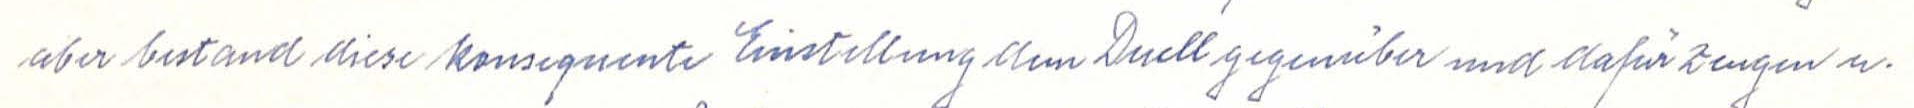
aber bestand diese konsequente Einstellung dem Duell gegenüber und dafür zeugen u.
